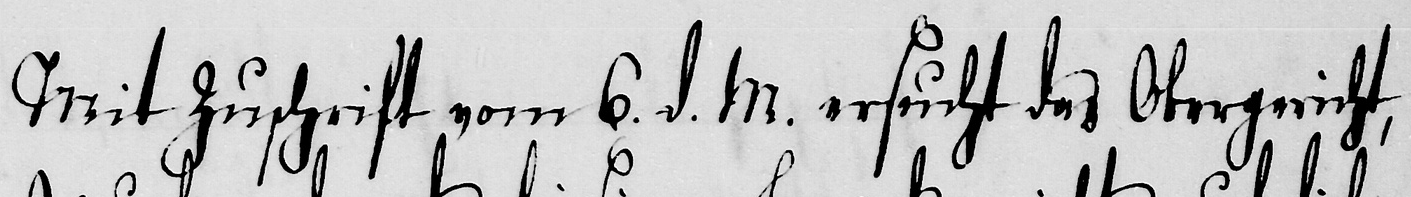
Mit Zuschrift vom 6. d. M. ersucht das Obergerich¬
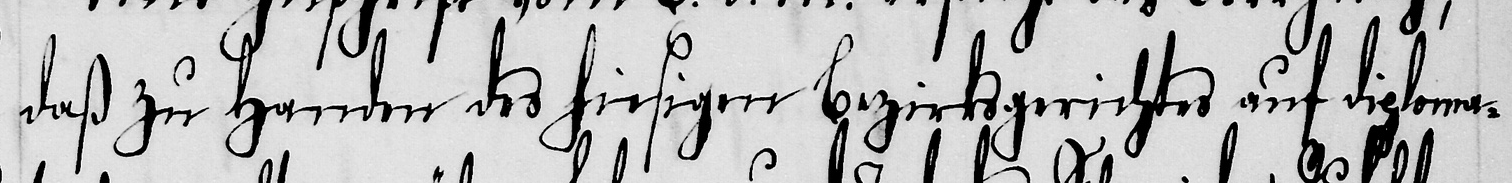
daß zu Handen des hiesigen Bezirksgerichtes auf diploma¬
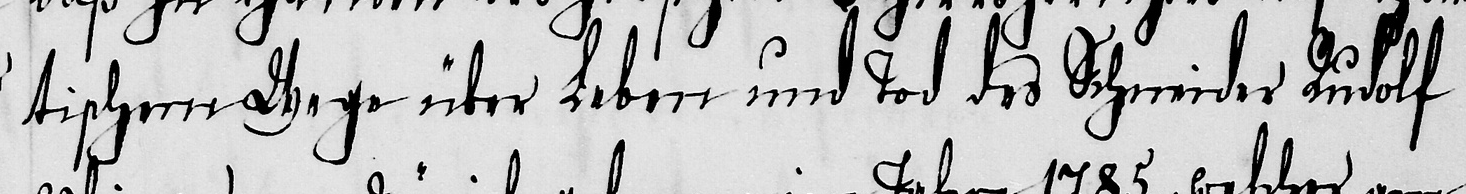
tischem Wege über Leben und Tod des Schneider Rudolf
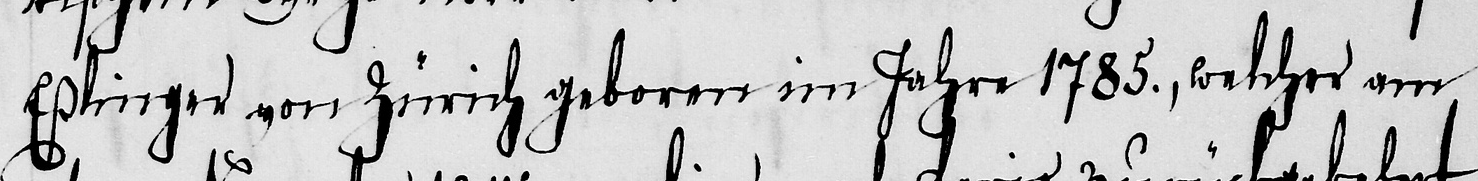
Eßlinger von Zürich geboren im Jahre 1785., welcher am
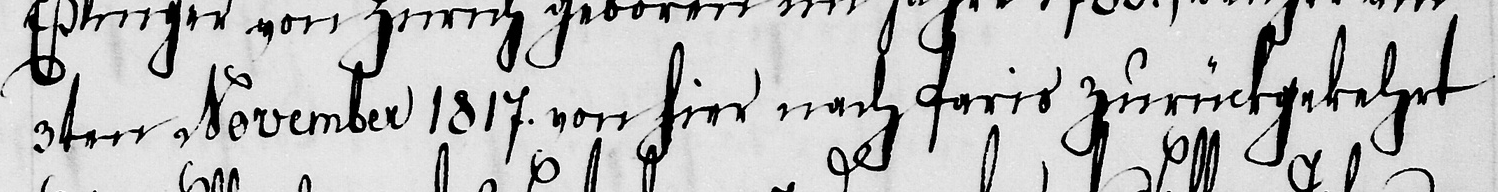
3ten November 1817. von hier nach Paris zurückgekehrt
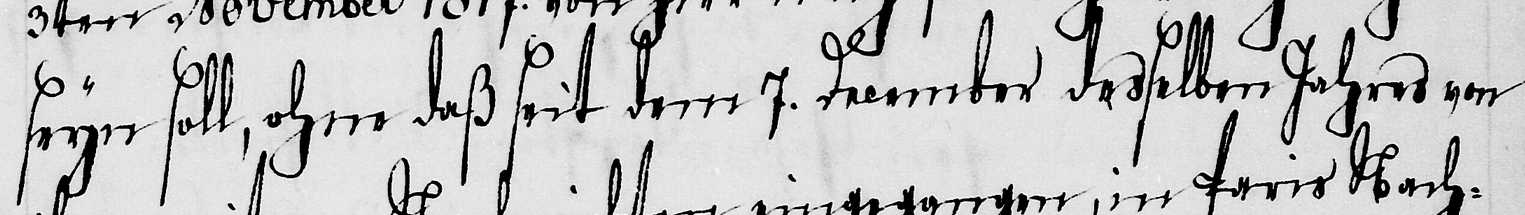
seyn soll, ohne daß seit dem 7. December desselben Jahres von
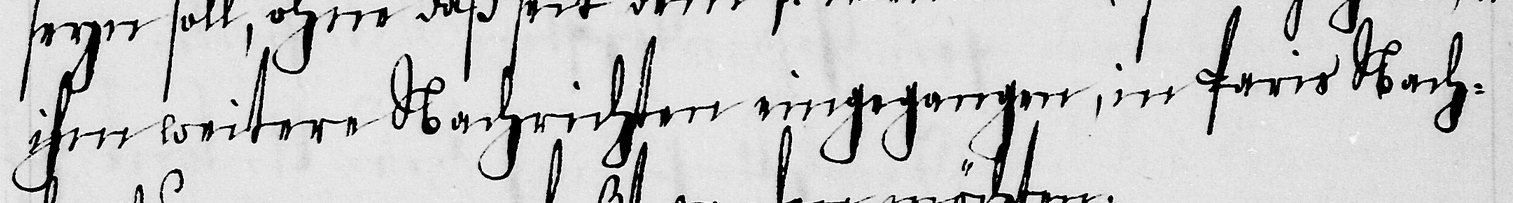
ihm weitere Nachrichten eingegangen, in Paris Nach¬
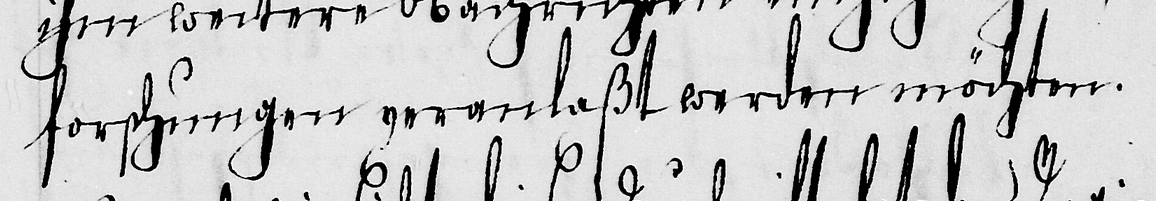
forschungen veranlaßt werden möchten.
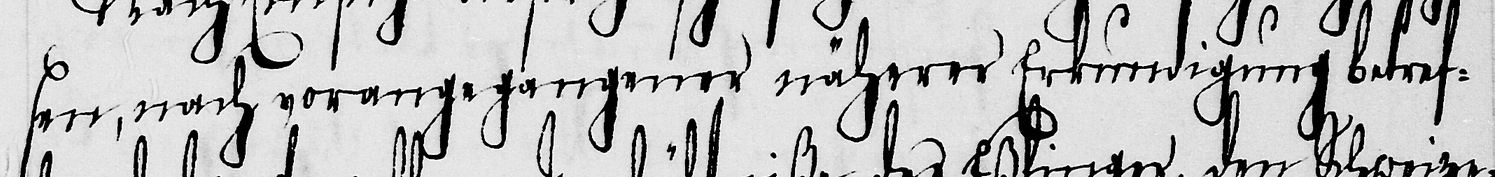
en, nach vorangegangener näherer Erkundigung betref¬
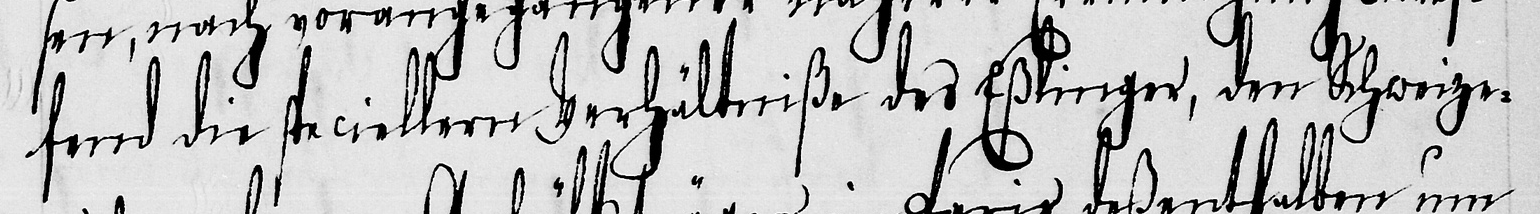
fend die speciellern Verhältniße des Eßlinger, den Schweize¬
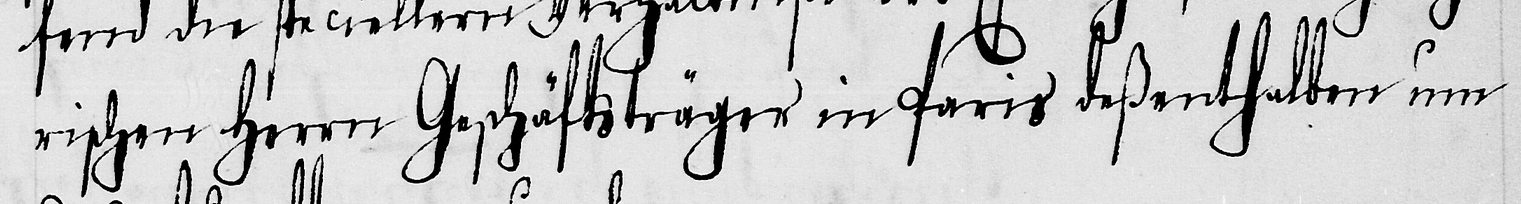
rischen Herrn Geschäftsträger in Paris deßenthalben um
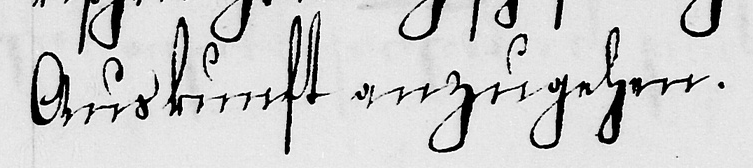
Auskunft anzugehen.
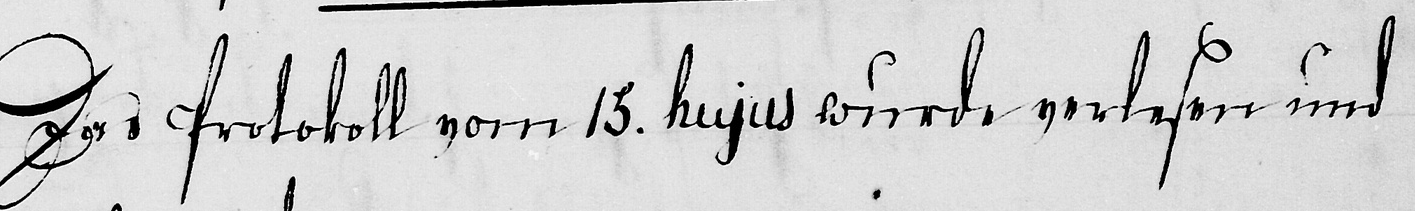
Das Protokoll vom 15. hujus wurde verlesen und
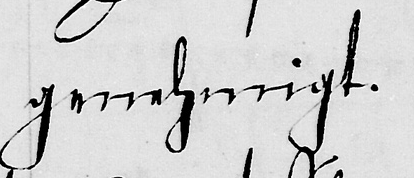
genehmigt.
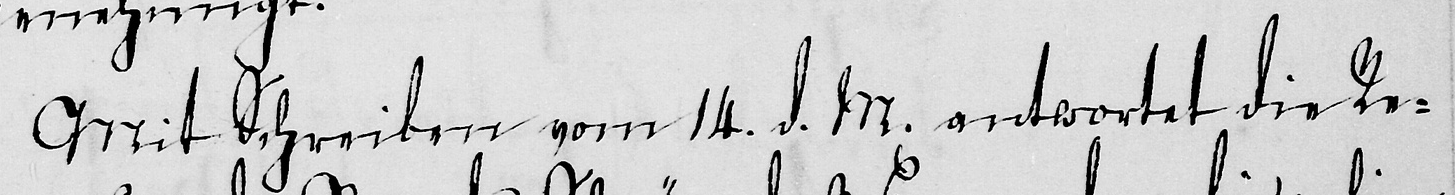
Mit Schreiben vom 14. d. M. antwortet die Re¬
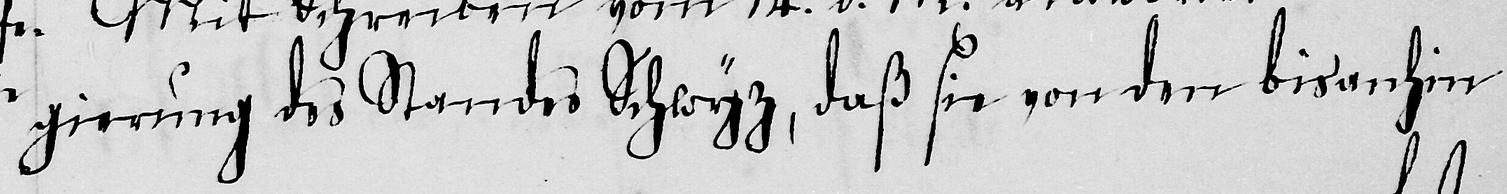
gierung des Standes Schwyz, daß sie von den bis anhin
